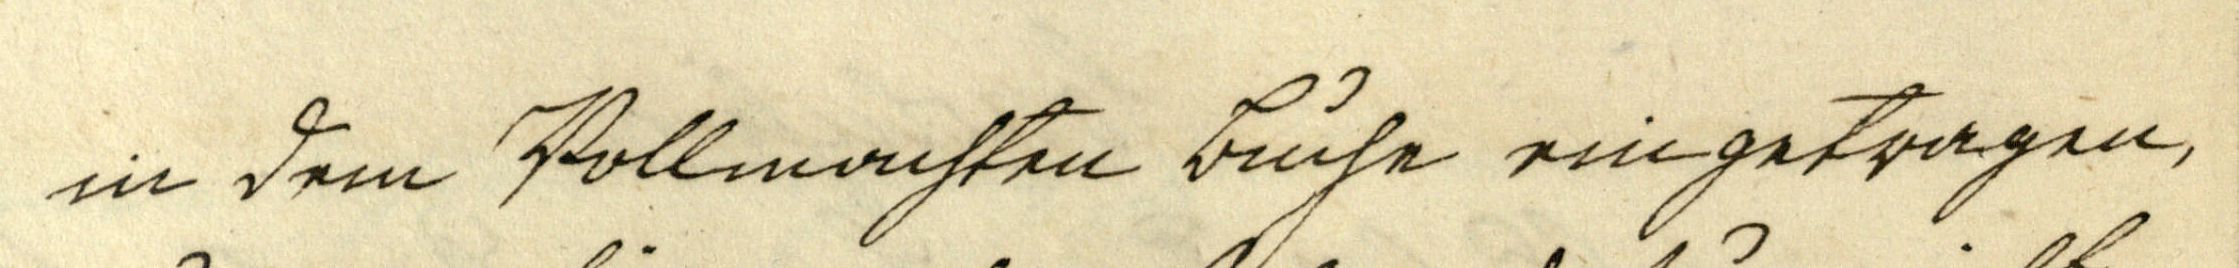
in dem Vollmachten Buche eingetragen,
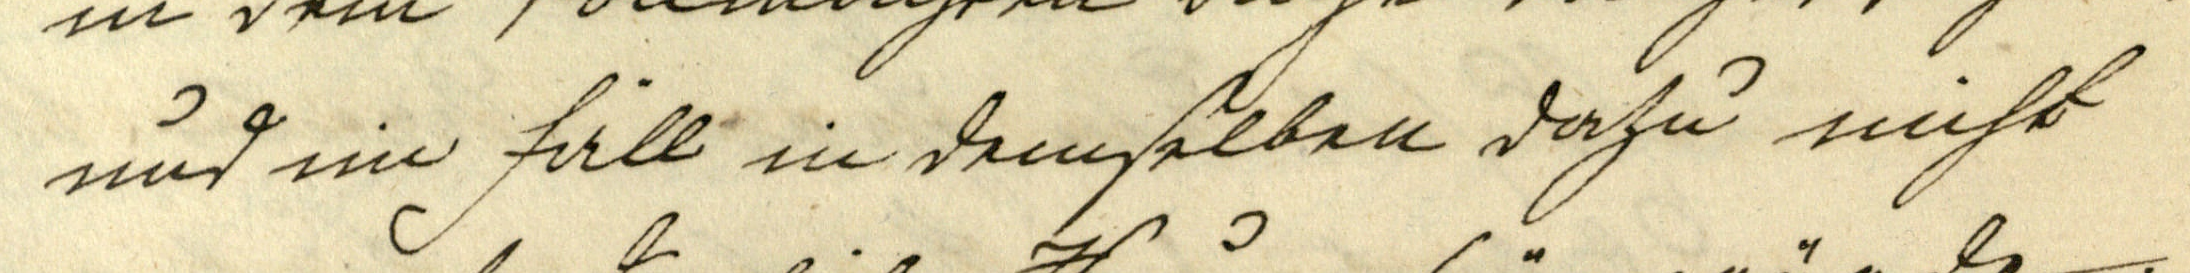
und im Fall in demselben dazu nicht
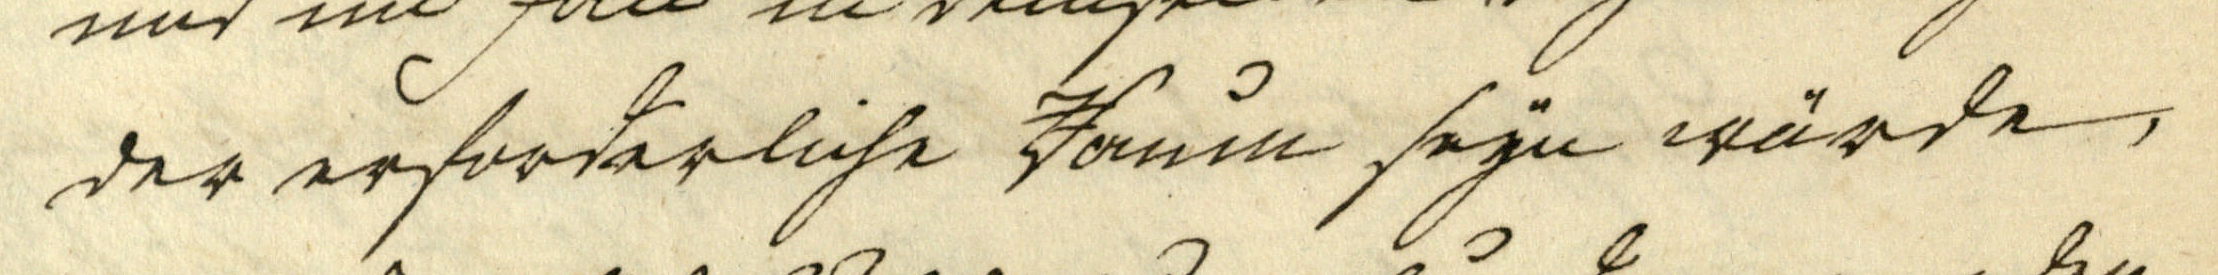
der erforderliche Raum seÿn würde,
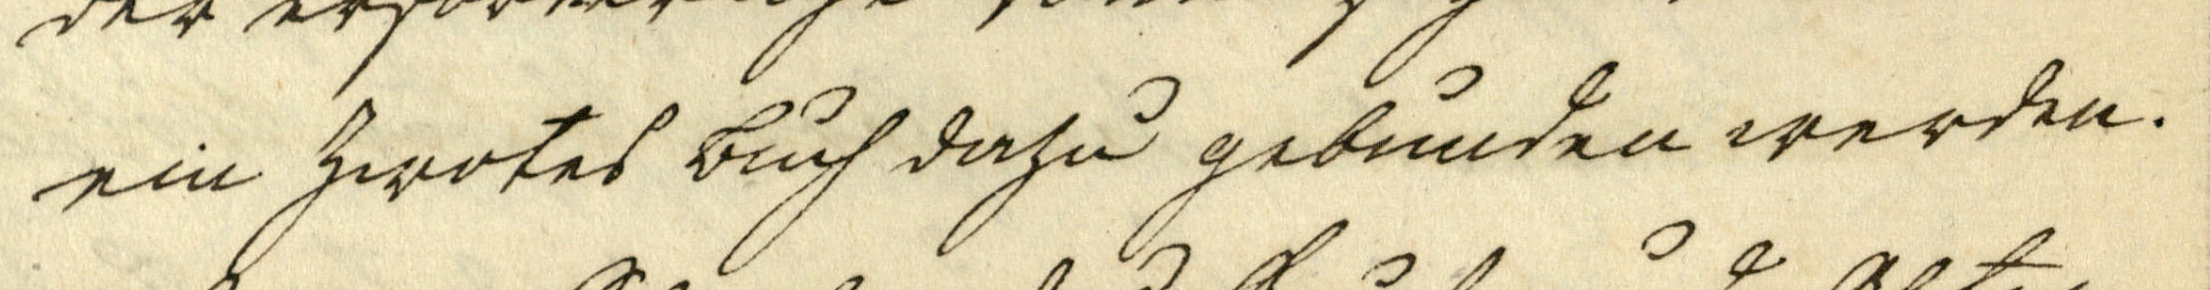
ein zwotes Buch dazu gebunden werden.
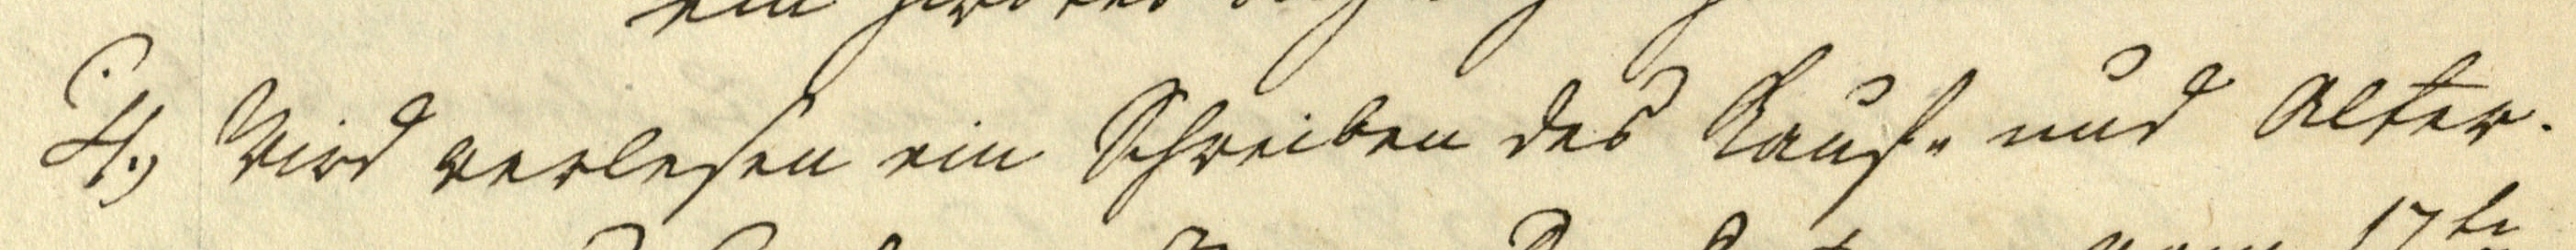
4., Wird verlesen ein Schreiben des Kauf- und Alter¬
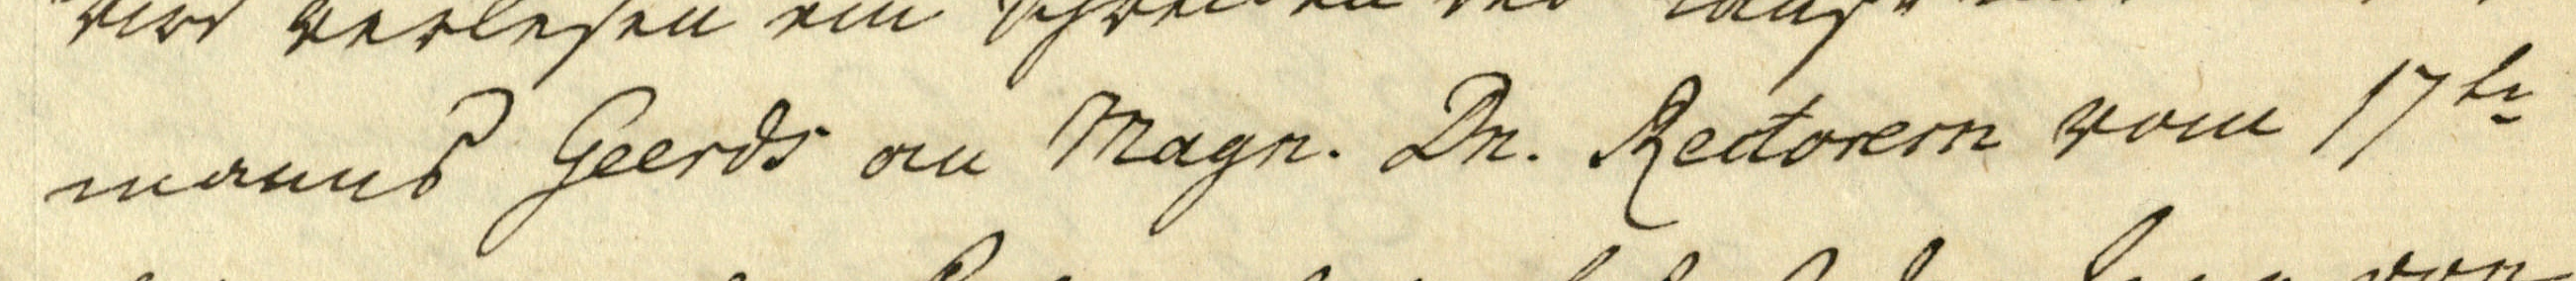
manns Geerds an Magn. Dn. Rectorem vom 17 t
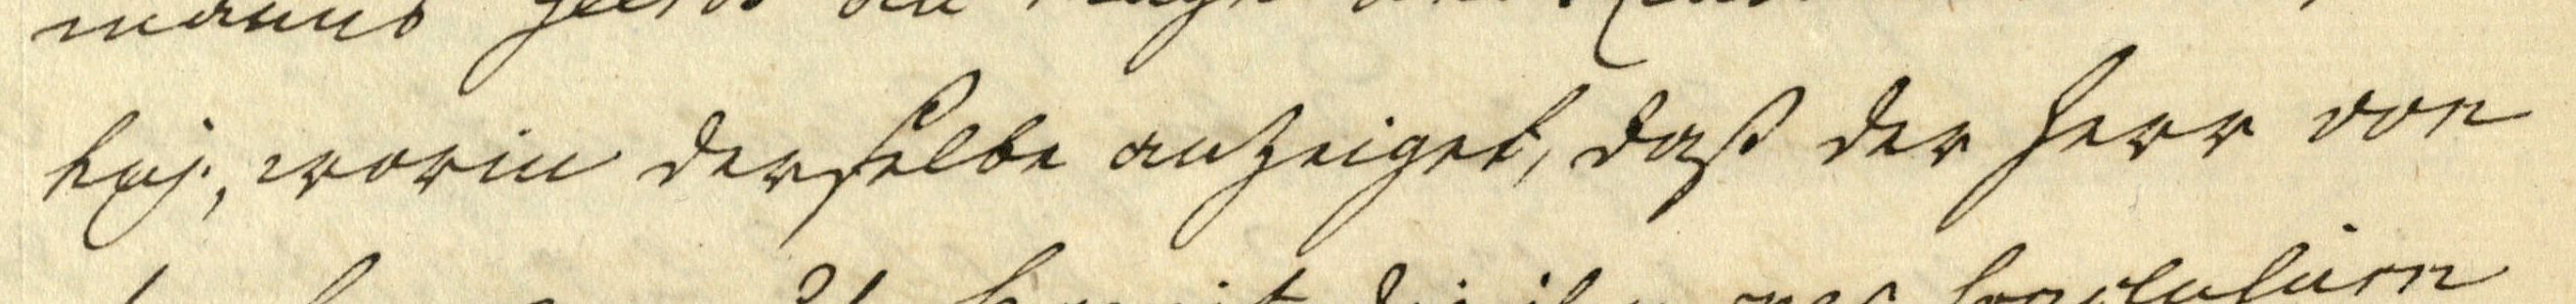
huj., worin derselbe anzeiget, daß der Herr von
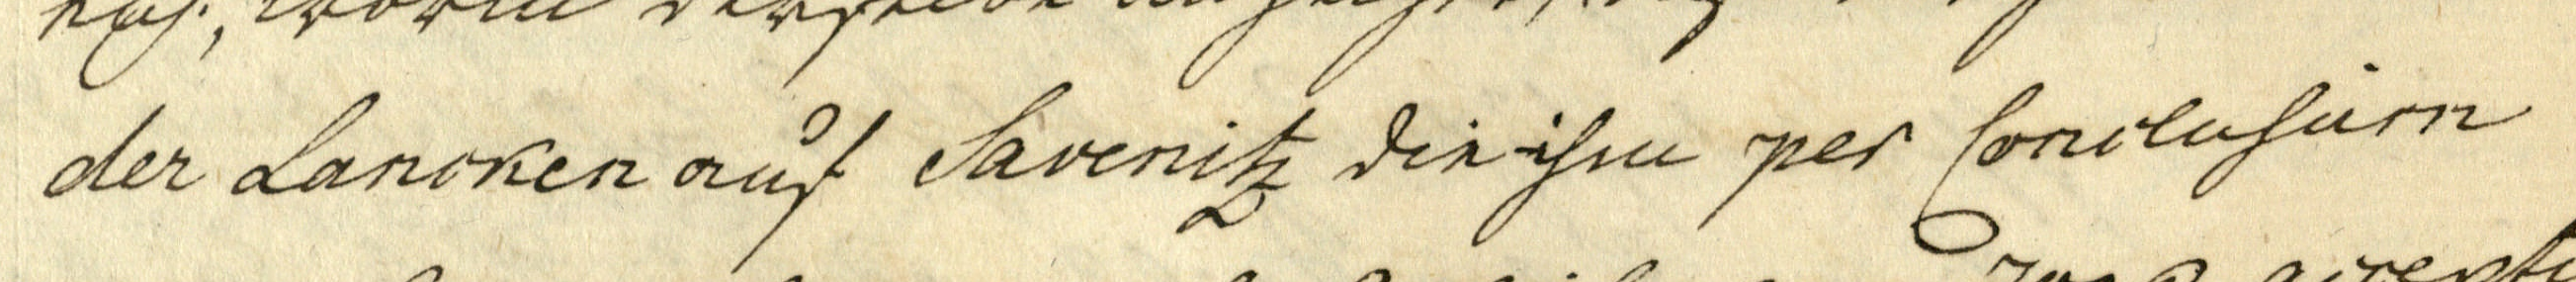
der Lancken auf Savenitz die ihm per Conclusum
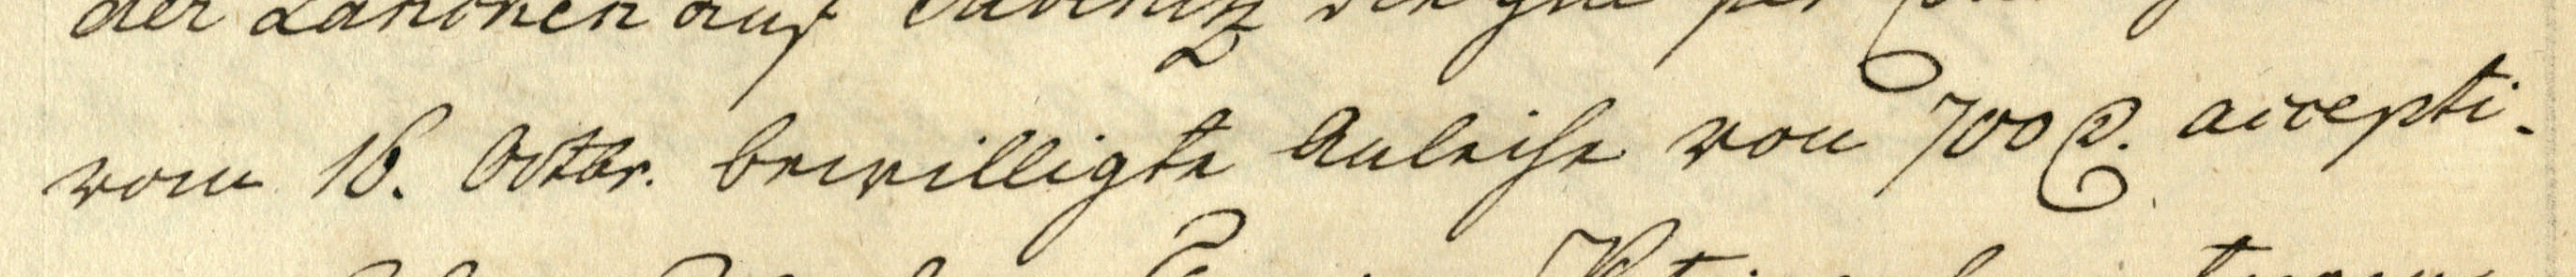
vom 16. Octbr. bewilligte Anleihe von 700 l. accepti¬
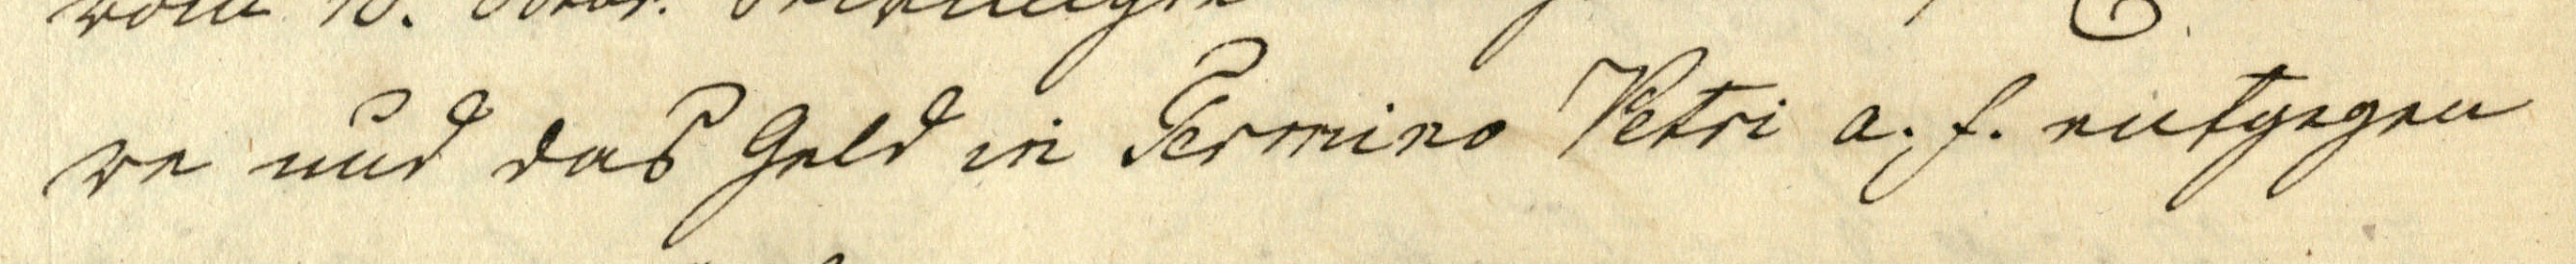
re und das Geld in Termino Petri a. f. entgegen
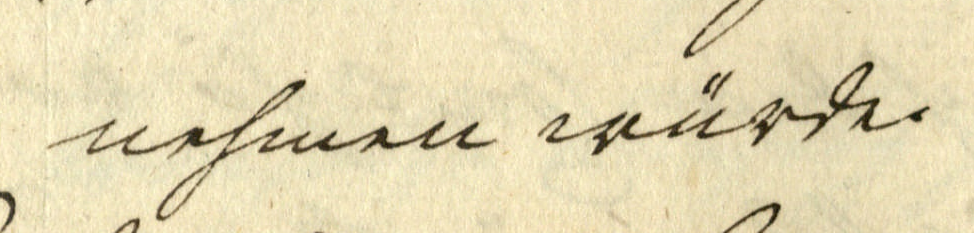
nehmen würde.
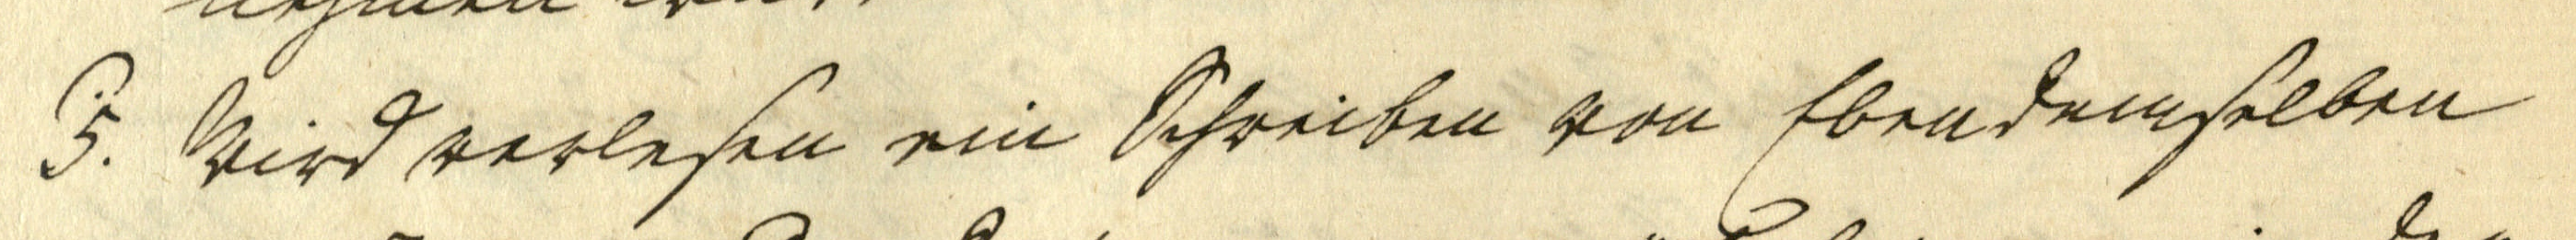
5. Wird verlesen ein Schreiben von Ebendemselben
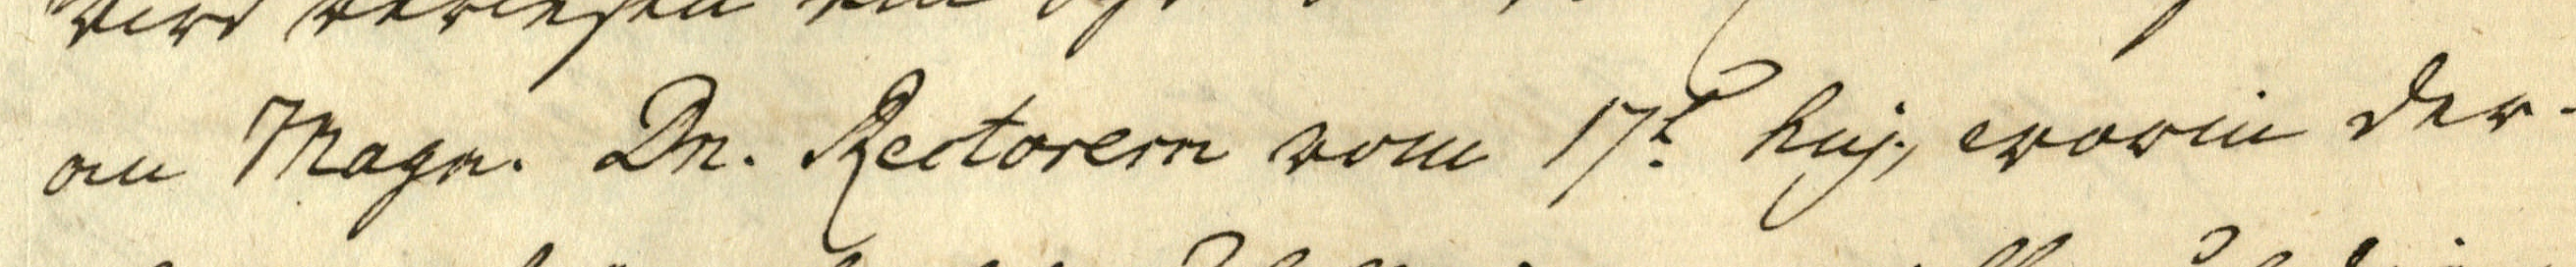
an Magn. Dn. Rectorem vom 17 t huj., worin der¬
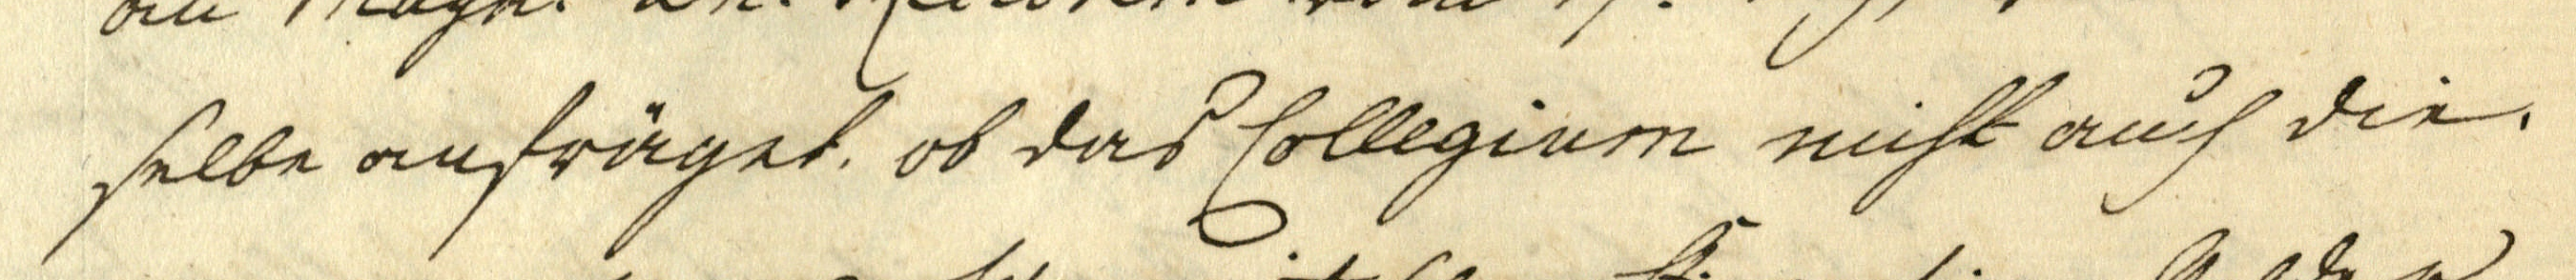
selbe anfräget, ob das Collegium nicht auch die¬
